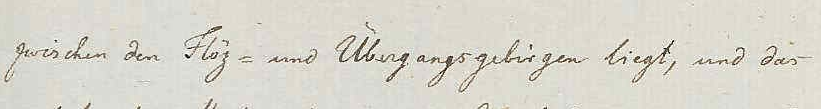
zwischen den Flöz- und Übergangsgebirgen liegt, und das
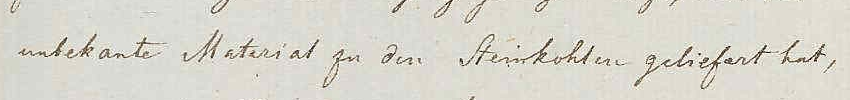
unbekante Material zu den Steinkohlen geliefert hat,
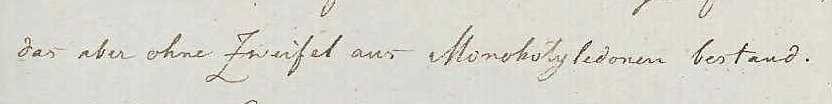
das aber ohne Zweifel aus Monokotyledonen bestand.
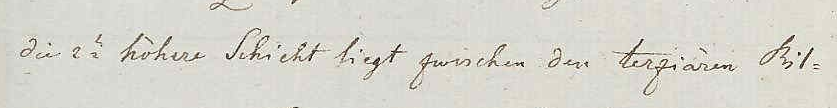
die 2￼ höhere Schicht liegt zwischen den terziären Bil-
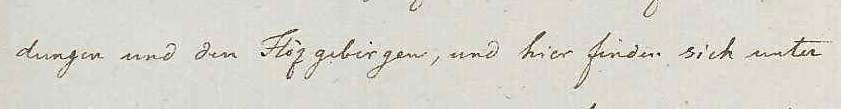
dungen und den Flözgebirgen, und hier finden sich unter
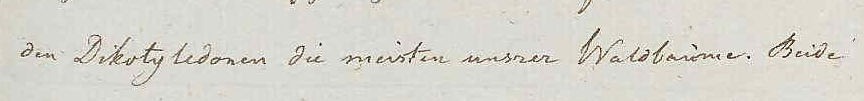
den Dikotyledonen die meisten unsrer Waldbäume. Beide
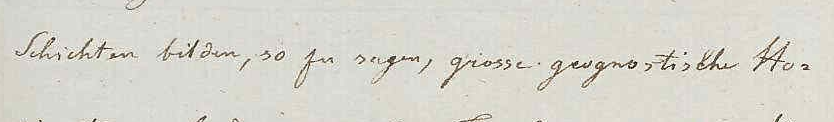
Schichten bilden, so zu sagen, grosse geognostische Ho-
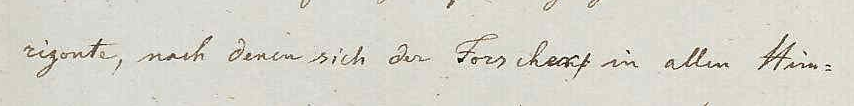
rizonte, nach denen sich der Forschunger in allen Him-
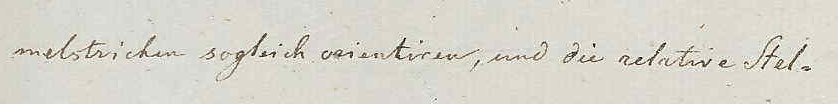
melstrichen sogleich orientiren, und die relative Stel-
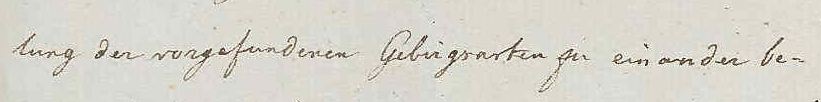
lung der vorgefundenen Gebirgsarten zu einander be-
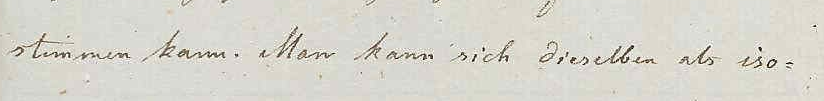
stimmen kann. Man kann sich dieselben als iso-
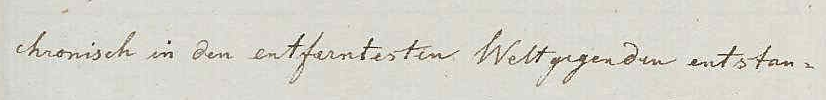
chronisch in den entferntesten Weltgegenden entstan-
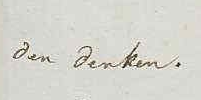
den denken.
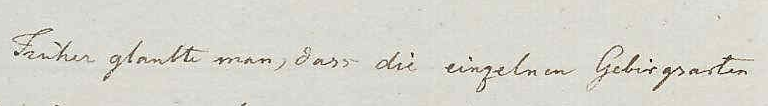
Früher glaubte man, dass die einzelnen Gebirgsarten
